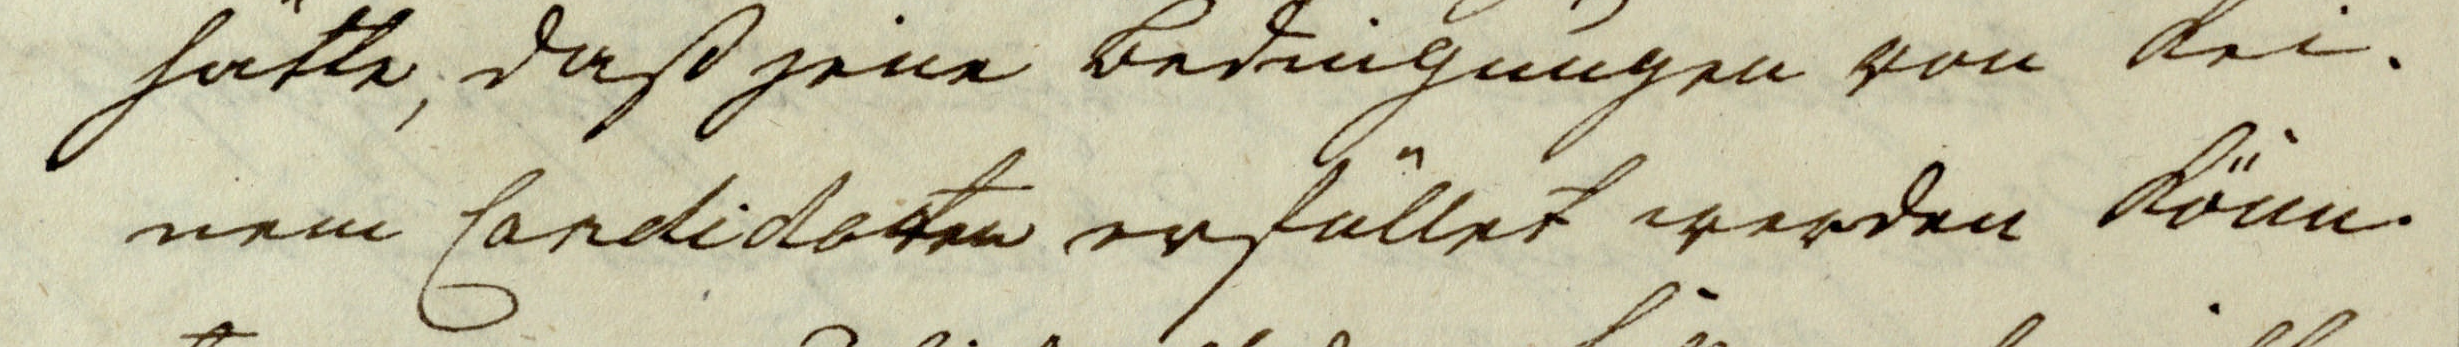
nem Candidaten erfüllet werden könn¬
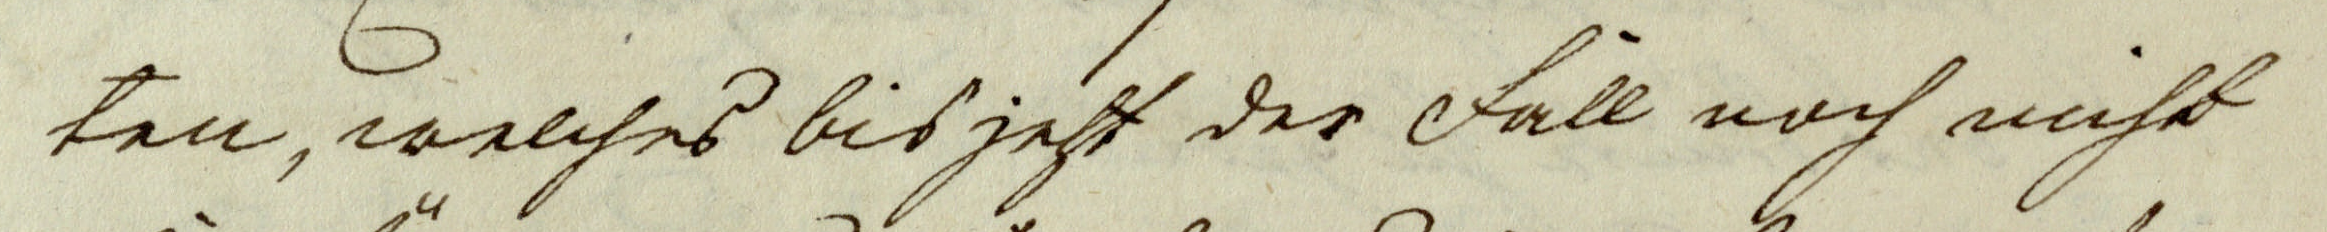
ten, welches bis jetzt der Fall noch nicht
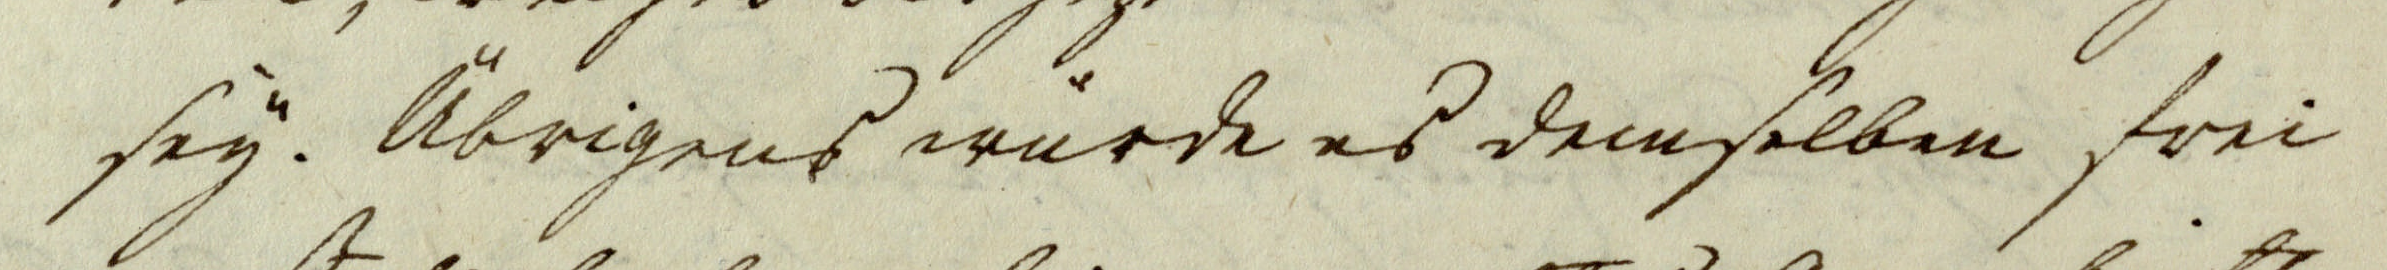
seÿ. Übrigens würde es demselben frei
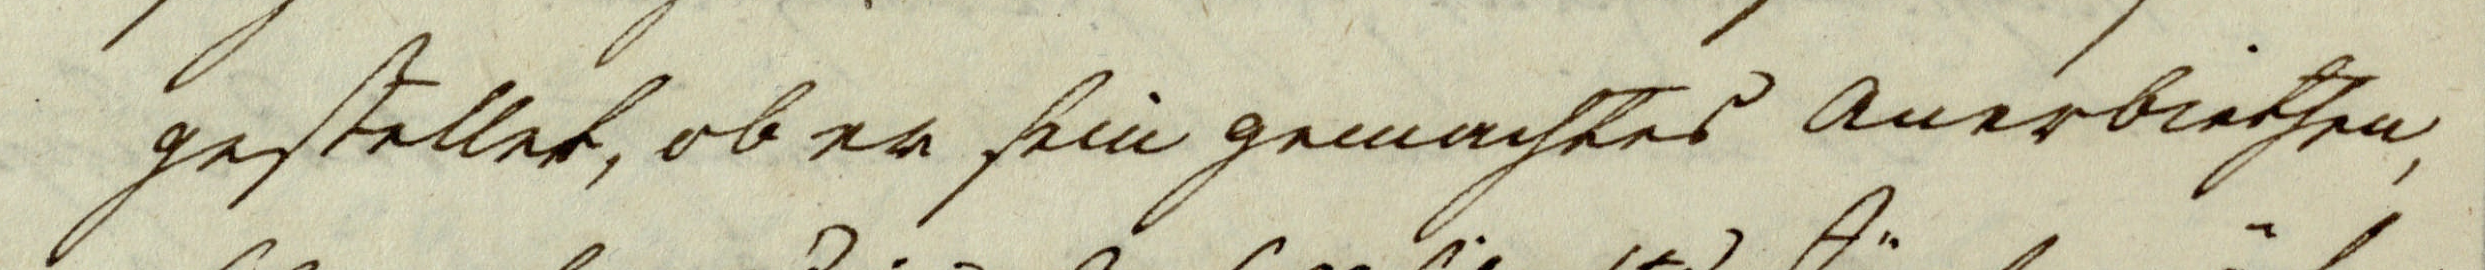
gestellt, ob er sein gemachtes Anerbiethen,
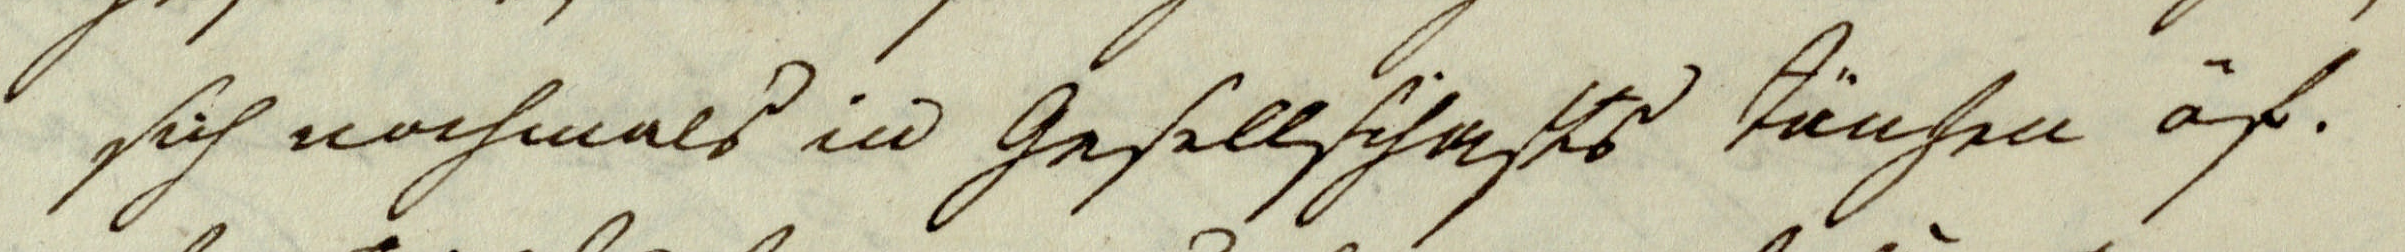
sich nochmals in Gesellschafts Tänzen öf¬
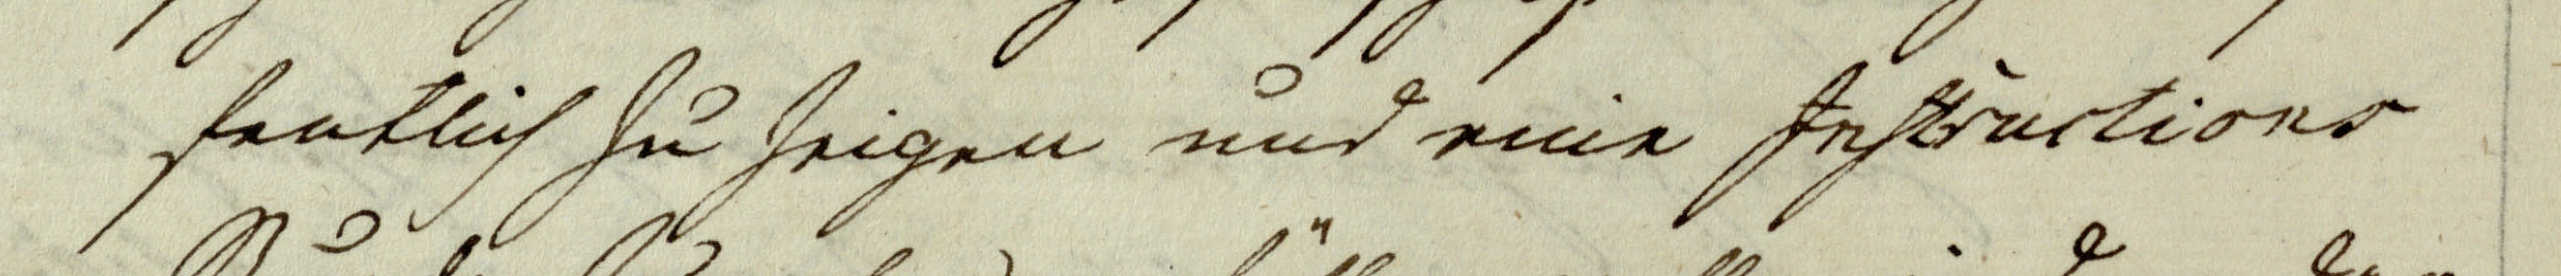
fentlich zu zeigen und eine Instructions
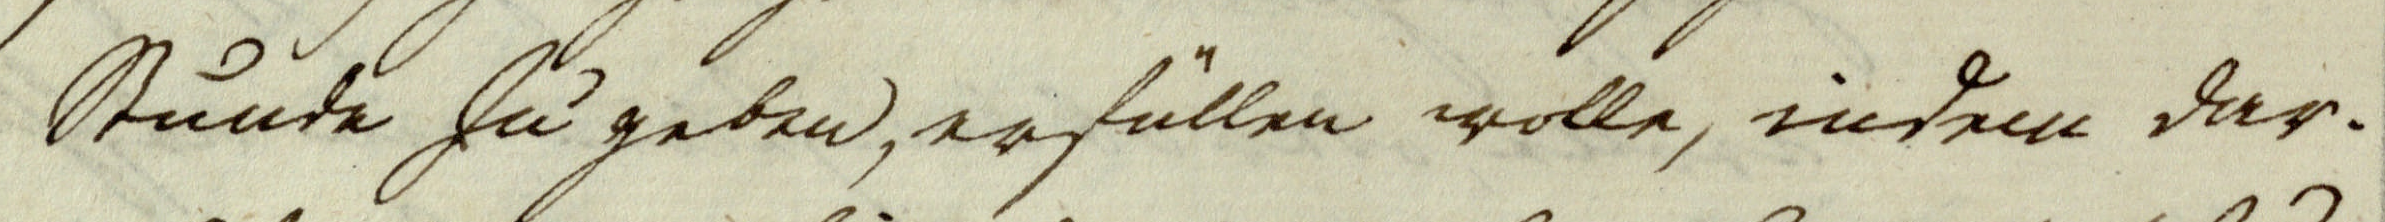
Stunde zu geben, erfüllen wolle, indem dar¬
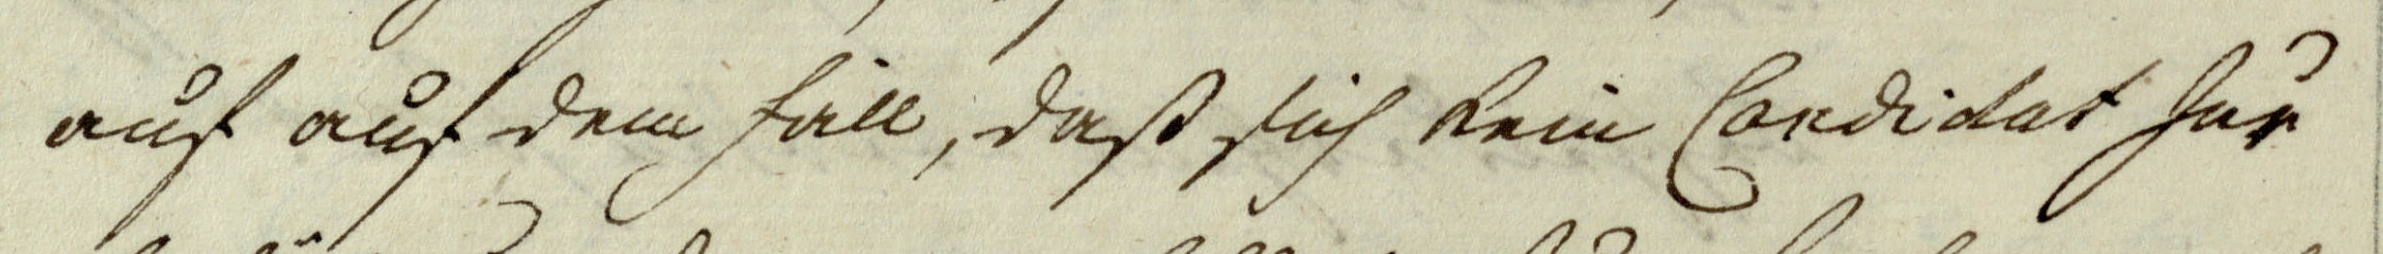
auf auf dem Fall, daß sich kein Candidat zur
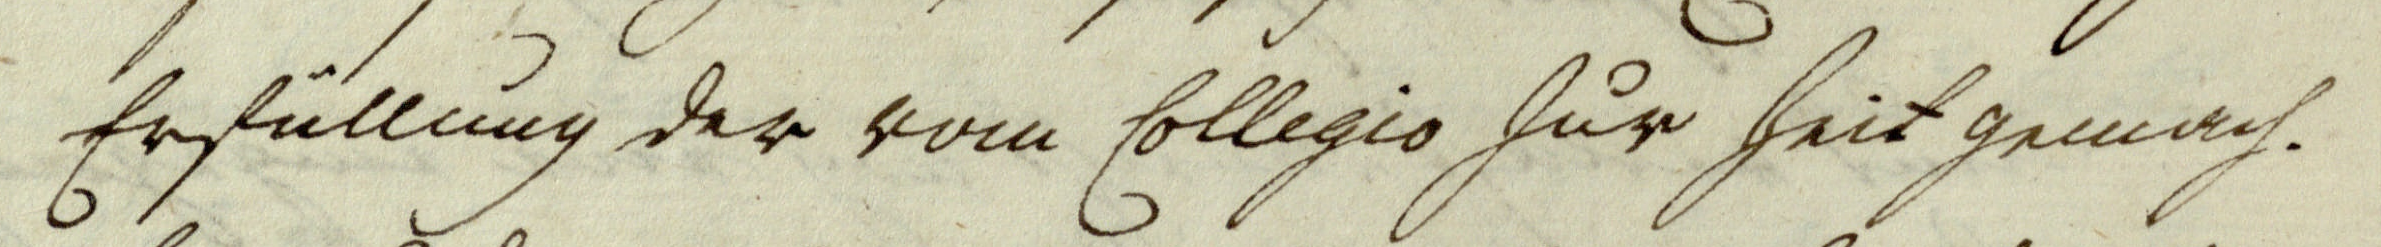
Erfüllung der vom Collegio zur Zeit gemach¬
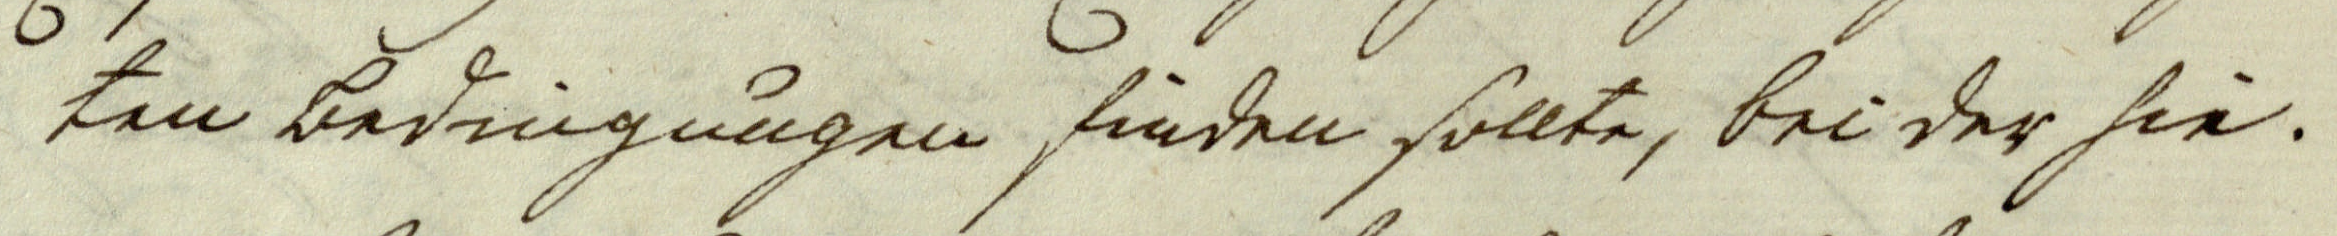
ten Bedingungen finden sollte, bei der hie¬
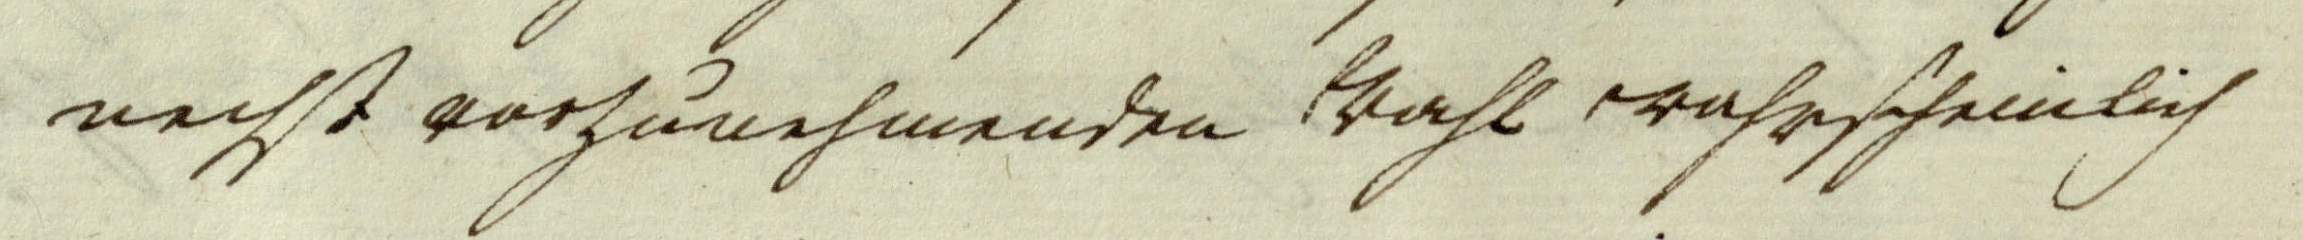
nechst vorzunehmenden Wahl wahrscheinlich
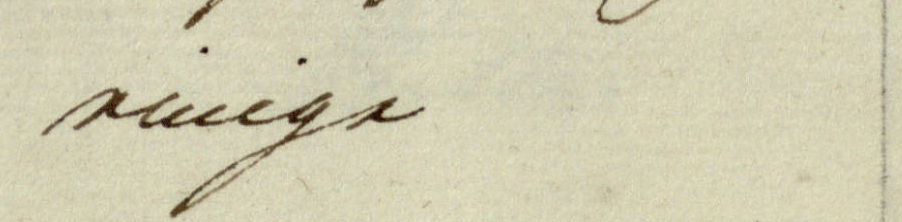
einige
